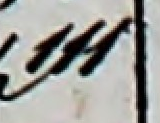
111
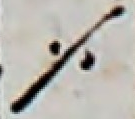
./.
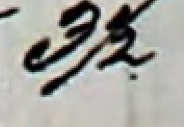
3 1/2
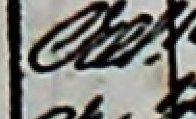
Alt
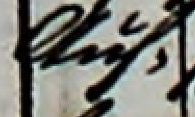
Auf„
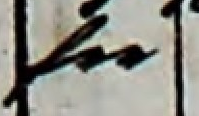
see
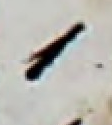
1
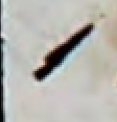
1
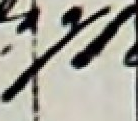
71
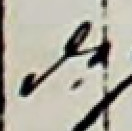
Do
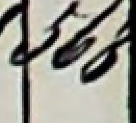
568
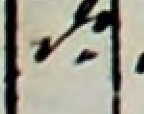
Do
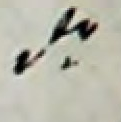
Do
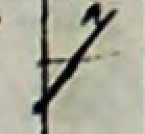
7
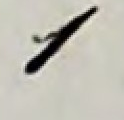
1
